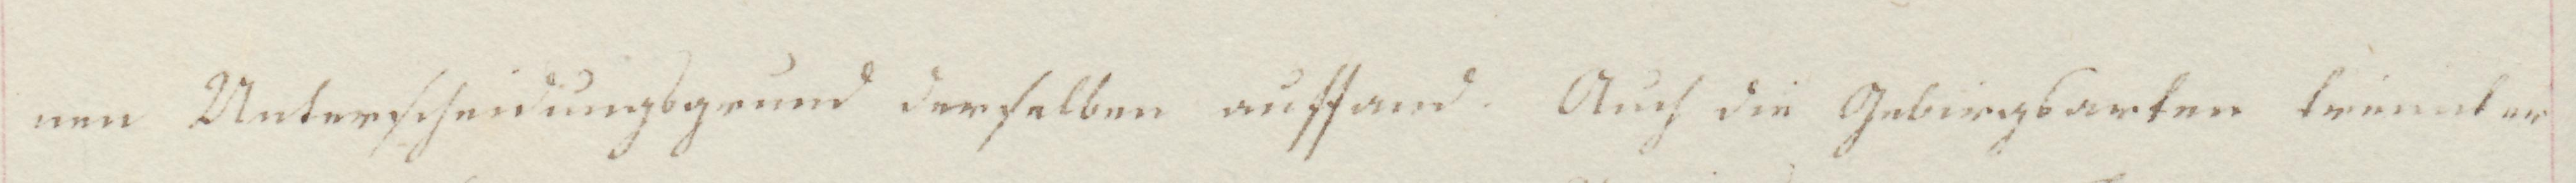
nen Unterscheidungsgrund derselben auffand. Auch die Gebirgsarten trennt er
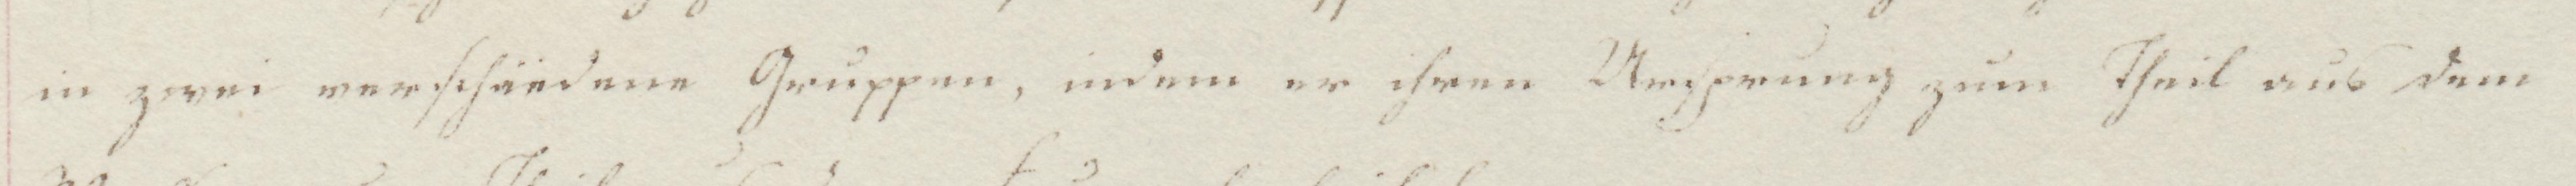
in zwei verschiedene Gruppen, indem er ihren Ursprung zum Theil aus dem
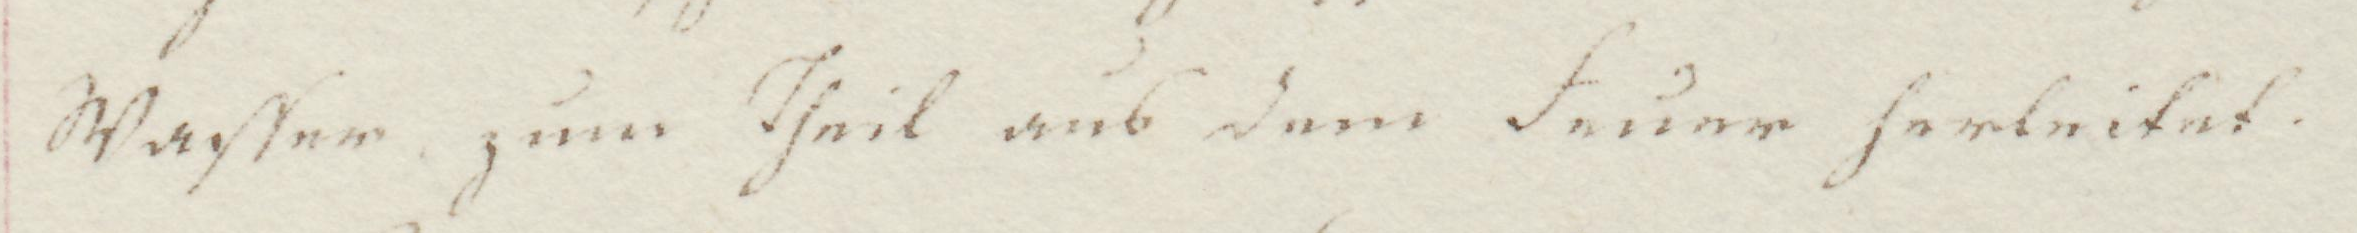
Wasser, zum Theil aus dem Feuer herleitet.
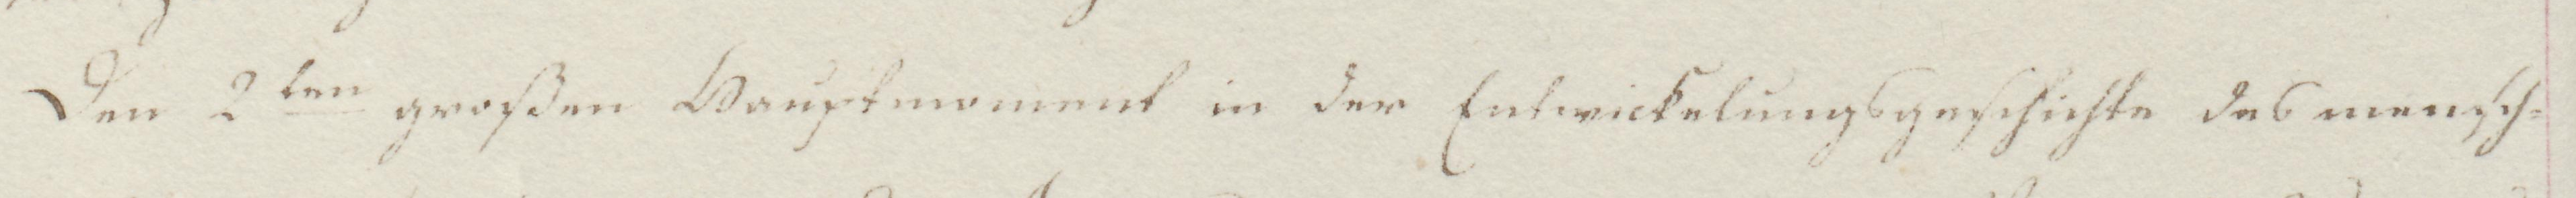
Den 2ten großen Hauptmoment in der Entwickelungsgeschichte des mensch-
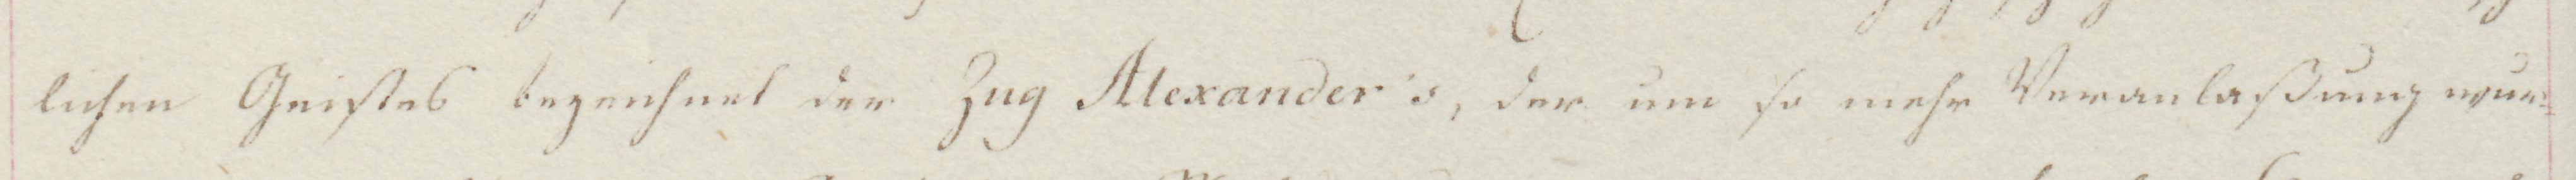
lichen Geistes bezeichnet der Zug Alexander's, der um so mehr Veranlaßung wur-
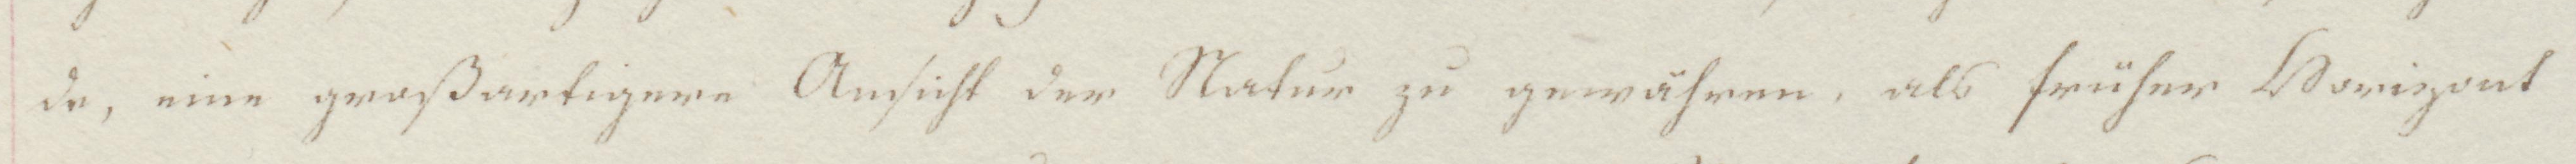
de, eine großartigere Ansicht der Natur zu gewähren, als früher Horizont
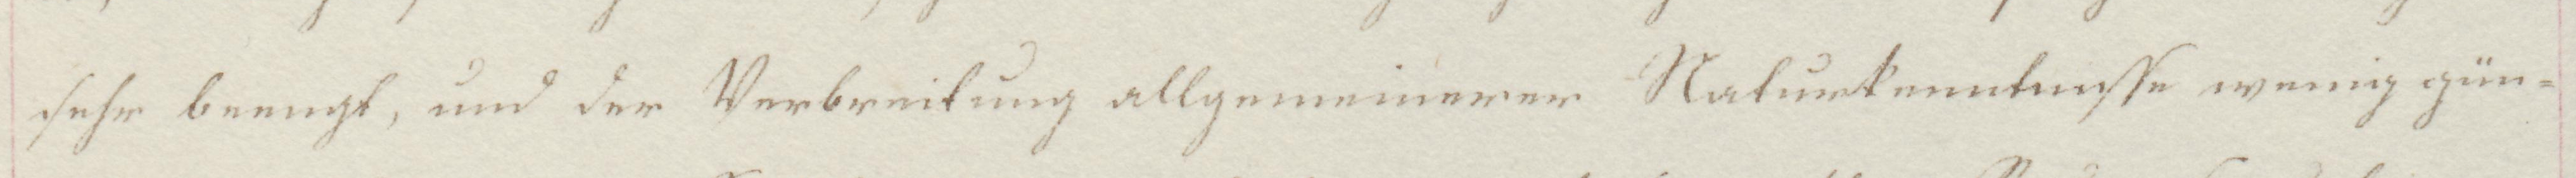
sehr beengt, und der Verbreitung allgemeinerer Naturkenntnisse wenig gün-
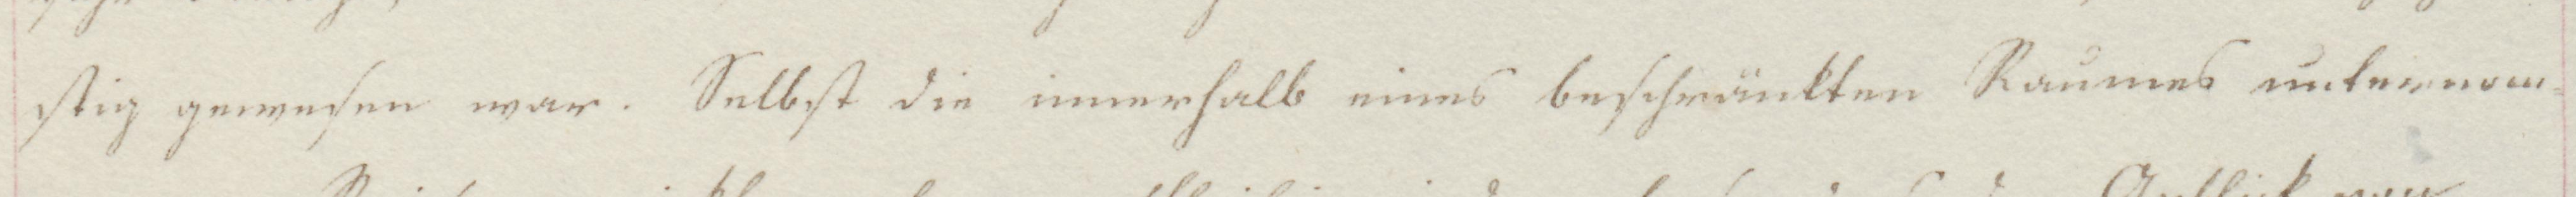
stig gewesen war. Selbst die innerhalb eines beschränkten Raumes unternom-
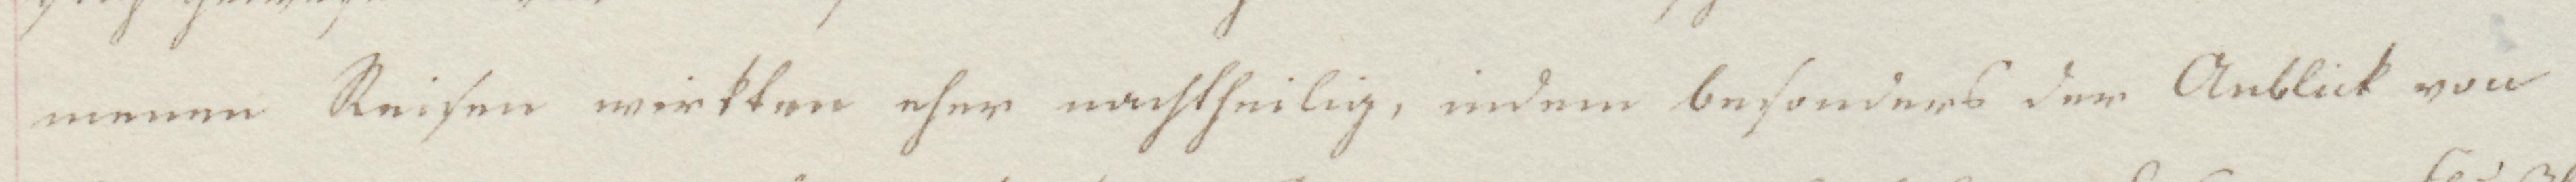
menen Reisen wirkten eher nachtheilig, indem besonders der Anblick von
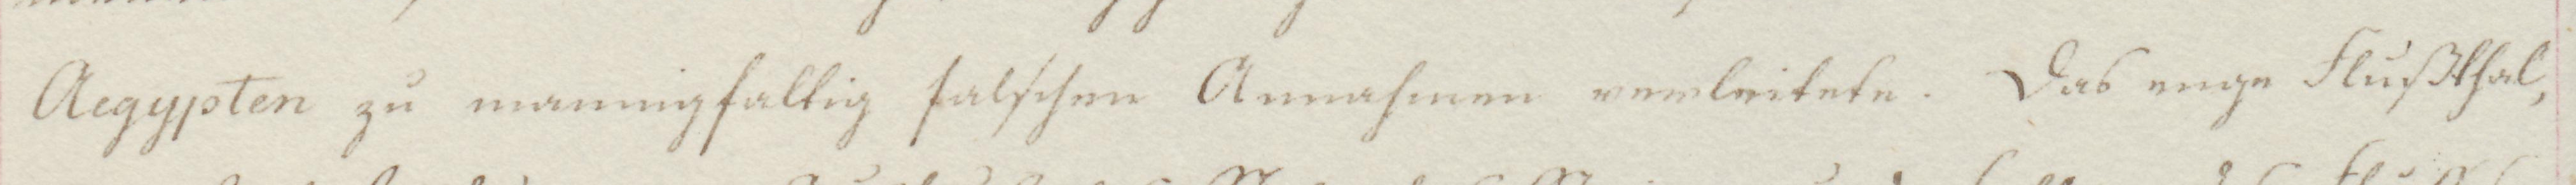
Aegypten zu mannigfaltig falschen Annahmen verleitete. Das enge Flußthal,
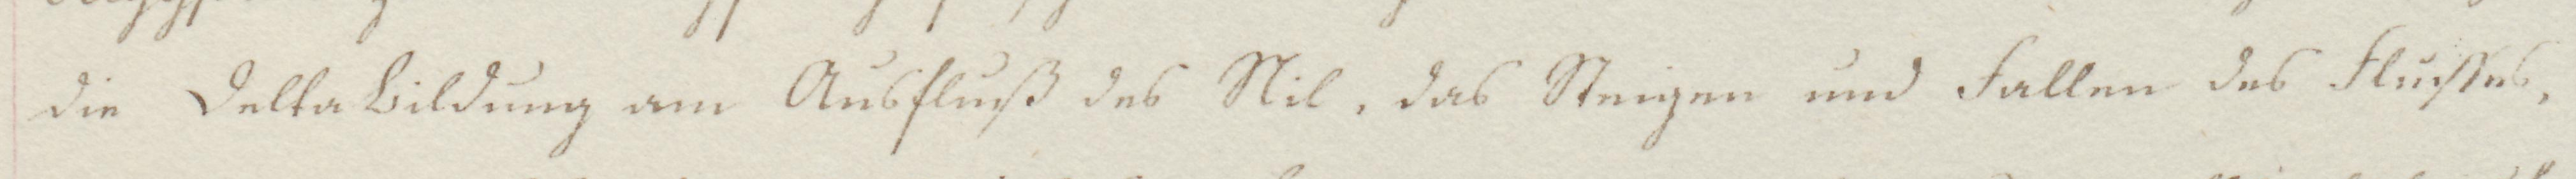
die Delta Bildung am Ausfluß des Nil, das Steigen und Fallen des Flusses,
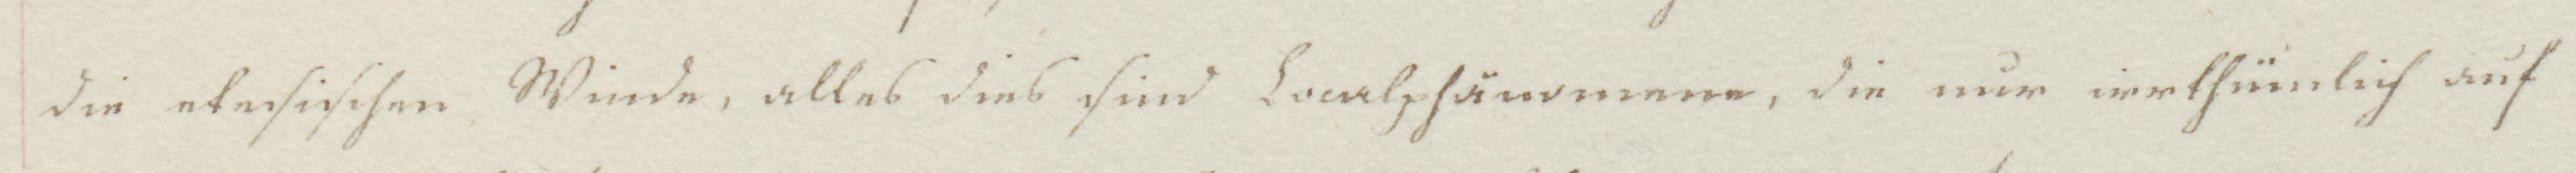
die etesischen Winde, alles dies sind Localphänomene, die nur irrthümlich auf
